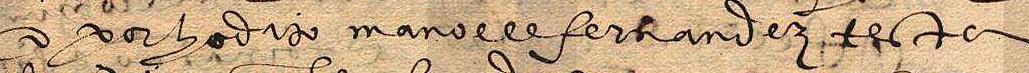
e por ho dito manoell fernandez testa
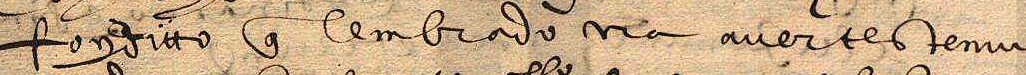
foy ditto q̄ lembrado era auer testemu
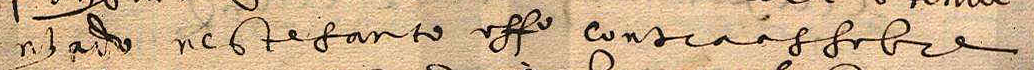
nhado neste santo offo contra as sobre
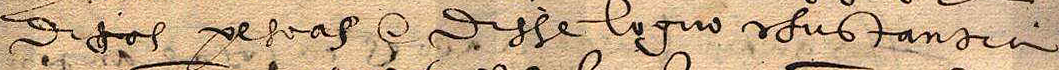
ditas pesoas e disse loguo ē sustantia
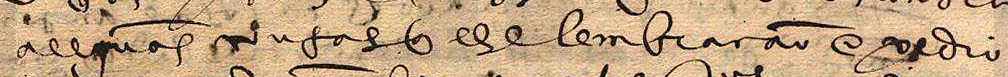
allgūas cousas q̄ lhe lembrarão e pedio
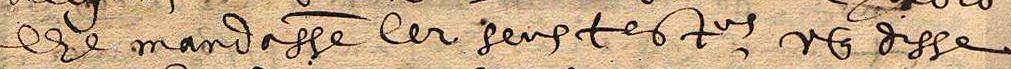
lhe mandassē ler seus testos ē q̄ disse
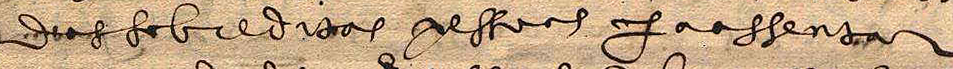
das sobreditas pessoas ꝑa assentar
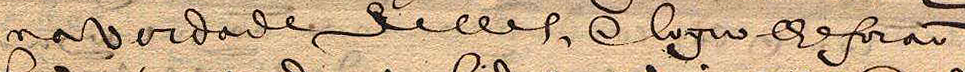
na verdade delles, e logo lhe foraõ
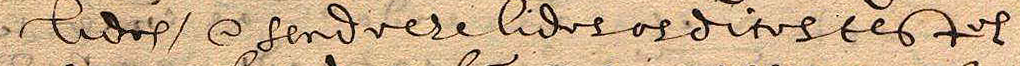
lidos / e sendolhe lidos os ditos testos
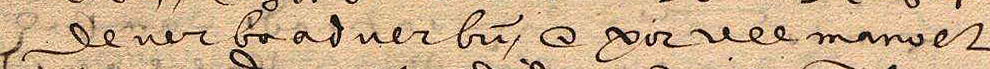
de uerbo ad uerbū, e por ele manoeL
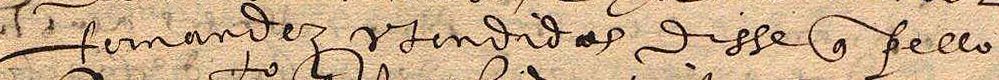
fernandez ētendidos disse q̄ pello
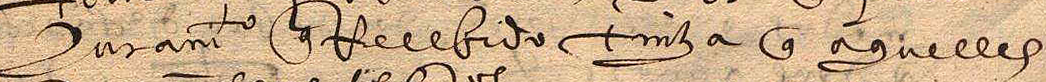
Juramto q̄ Recebido tinha q̄ aquelles
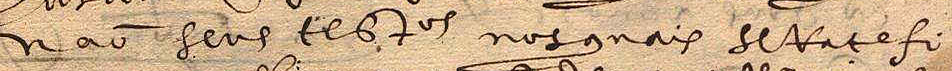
eraõ seus testos nos quais se Ratefi
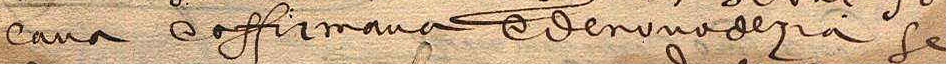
caua e affirmaua e de nouo dezia se
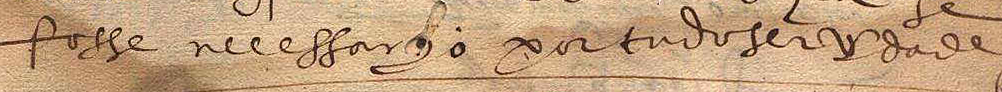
fosse necessaryo por tudo ser ꝟdade
